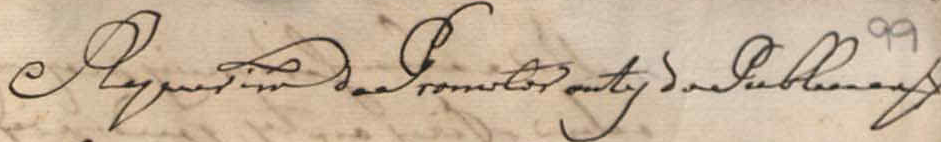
Requerimto do Promotor antes da Publicaçaõ
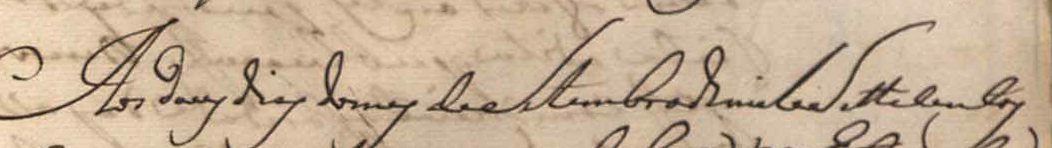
Aos dous dias do mes de Setembro de mil e Settecentos
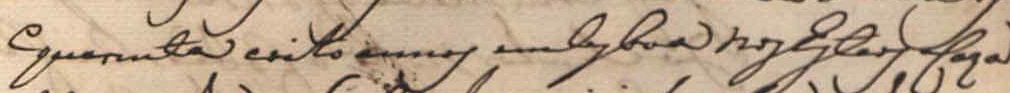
e quarenta e oito annos em lisboa nos Estaos e Caza
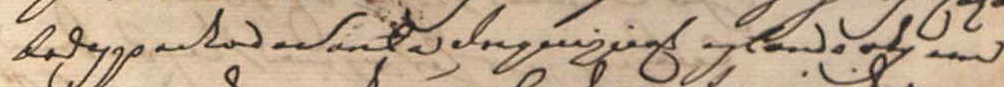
do despacho da Santa Inquiziçaõ estando ahy em
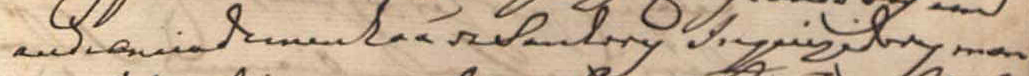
audiencia de menhaã os Senhores Inquizidores man
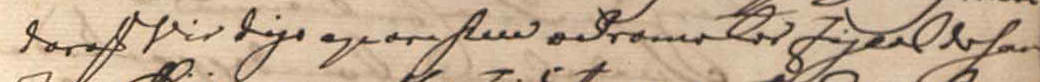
daraõ Vir digo e paresseu o Promotor fiscal do san
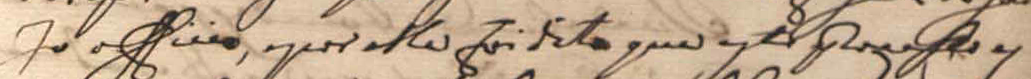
to officio, e por elle foi dito que este pRocesso es
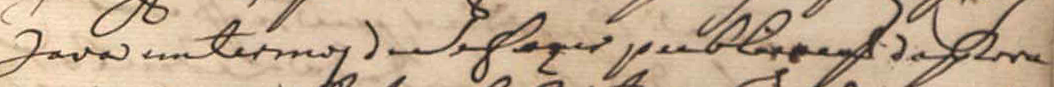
tava em termos de se fazer publicaçaõ de pRova
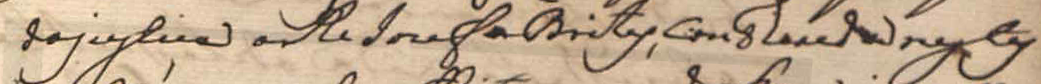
da justiça a Re Iozefa Brites, Contheuda nestes
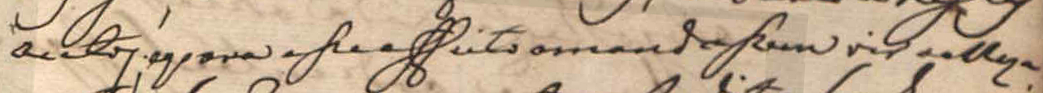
autos, e para esse effeito a mandassem vir a Meza
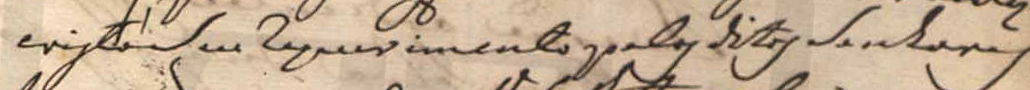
e visto seu Requerimento pelos ditos Senhores
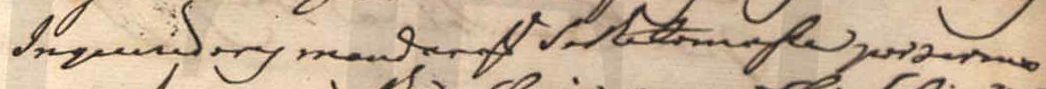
Inquizidores mandaraõ se lhe tomasse por termo
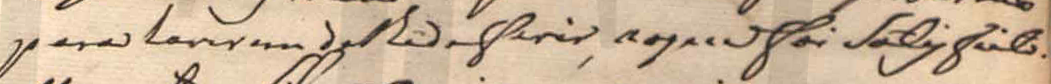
para haverem de lhe deferir, ao que foi satisfeito.
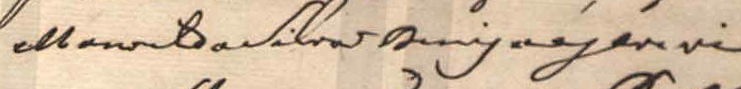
Manoel da Silva Denis a escrevi
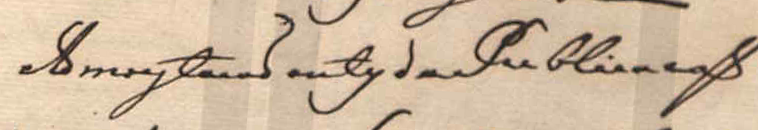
Amoestaçaõ antes da Publicaçaõ
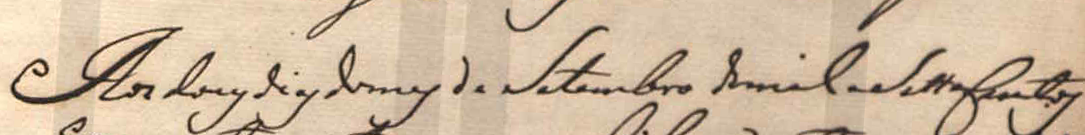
Aos dous dias do mes de Setembro de mil SetteCentos
